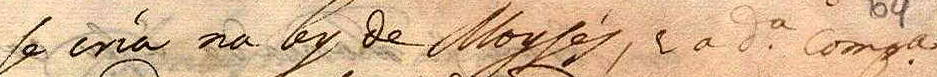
se cria na ley de Moyses, E a d.a compa.
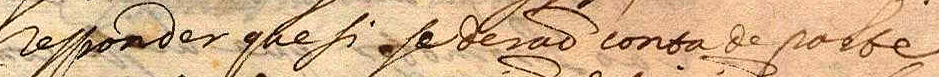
Responder que si se derão conta de parte
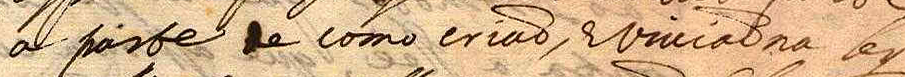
a parte de como crião, E viuuião na ley
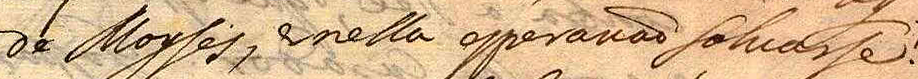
de Moyses, E nella esperauão saluarse?
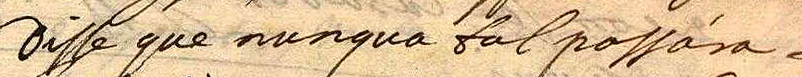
disse que nunqua tal passara
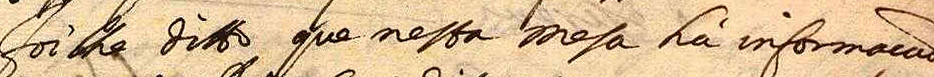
foi lhe ditto que nesta mesa há informação
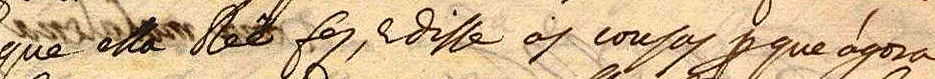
que ella Reê fez, E disse as cousas ꝑ que agora
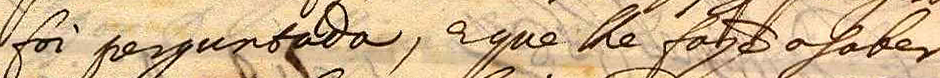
foi perguntada, E que lhe fazē a saber
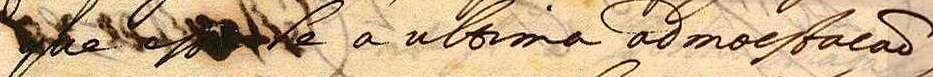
que es_ he a ultima admoestação,
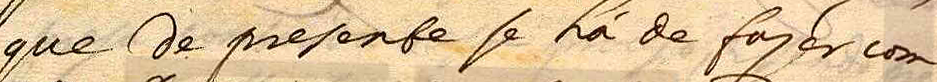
que de presente se há de fazer com
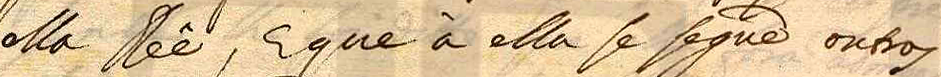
ella Reê, E que à ella se seguē outros
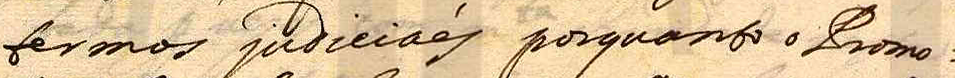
termos judiciaés porquanto o Promo
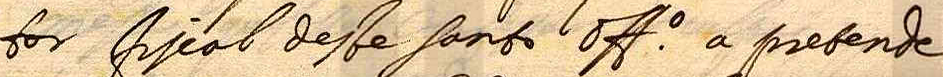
tor fiscal deste santo off.o a pretende
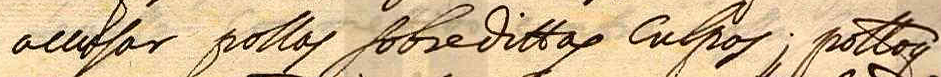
accusar pollas sobredittas culpas; pollo q̄
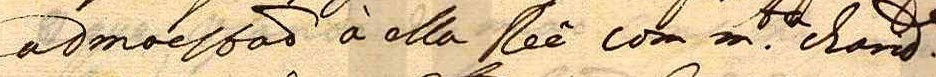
admoestão à ella Reê com m.ta charid.e
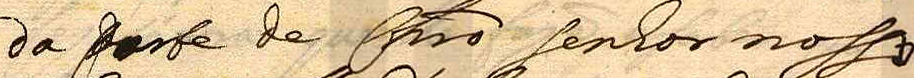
da parte de Chr̄o senhor nosso
